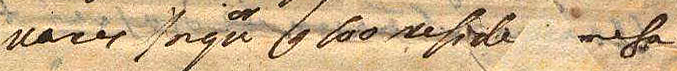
uares Inquor q̄ soo reside mesa.
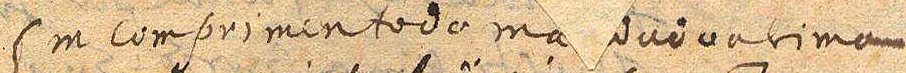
Em comprimento do ma dado asima
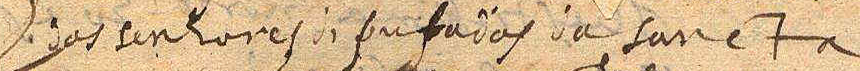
dos senhores diputados da sancta
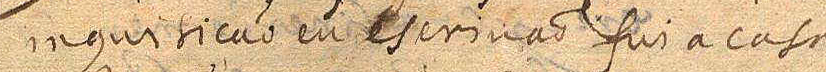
inquisiçaõ eu escriuaõ fui a casa
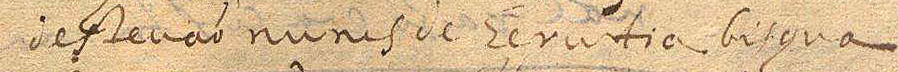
desteuaõ nunes de herutia bisqua
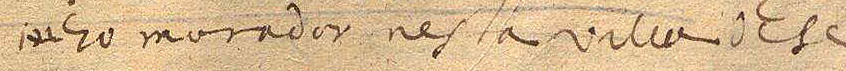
inho morador nesta villa de se
